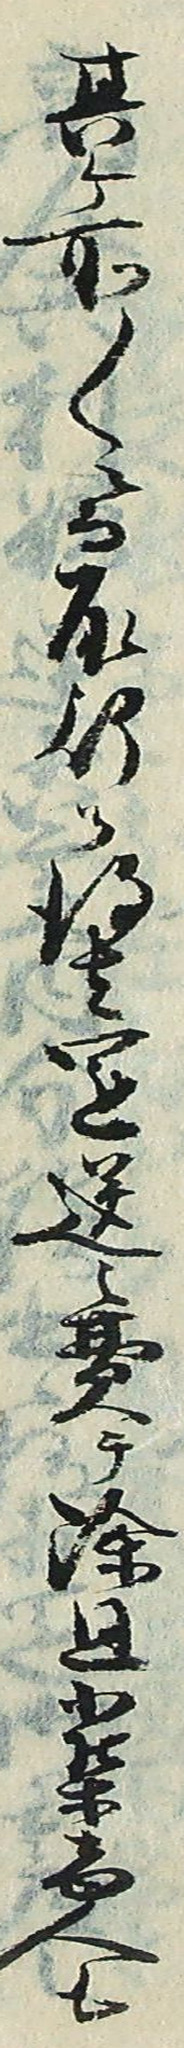其ケ所〳〵に而取行候得者運送に費を除且小集商人も
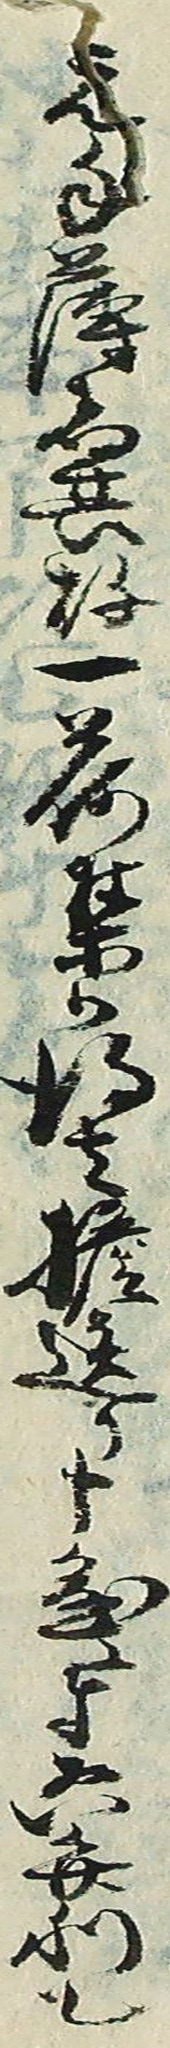元手薄者共故一荷集候得者担送り申懸に付右弁利も
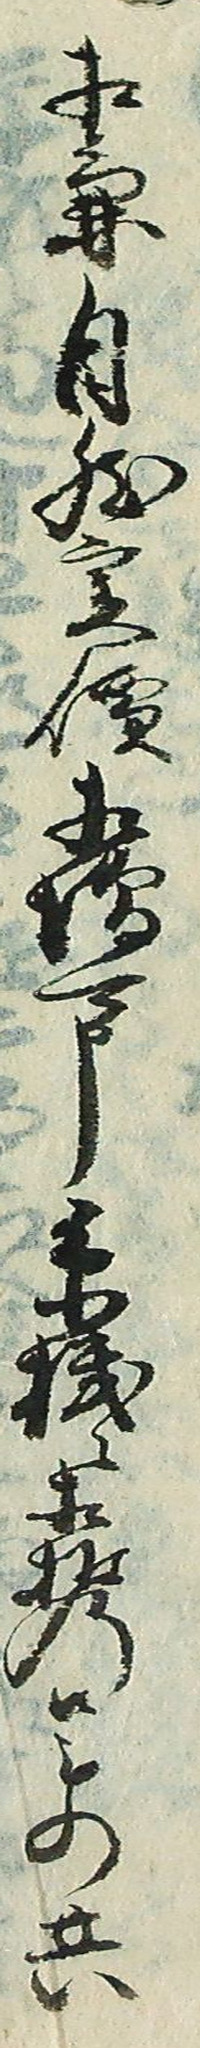相兼自然実価相増可申糸機に相携候もの共
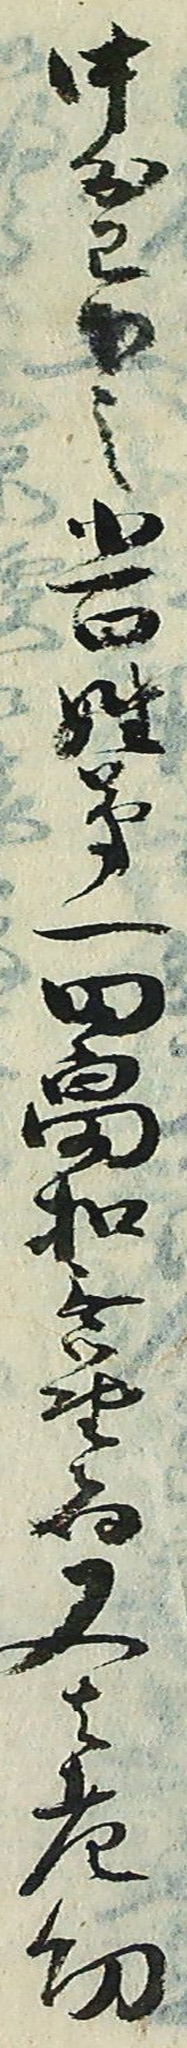中分已下之小百姓第一田畠扣無御坐者又者老幼
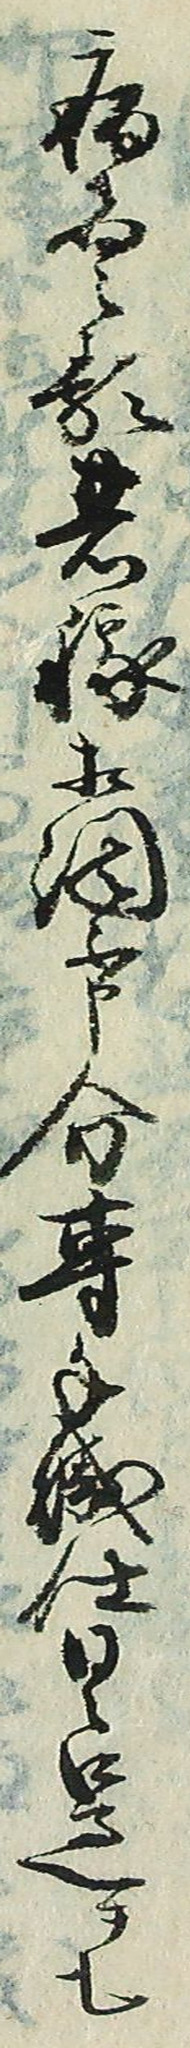病者之類農稼相調不申分専手織仕日々口過をも
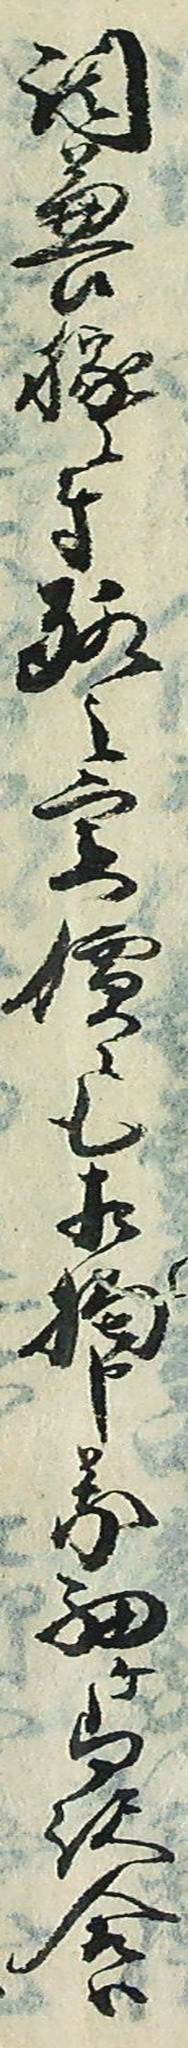調兼候稼に付聊之実価にも相拘申義細ケ布訳合は
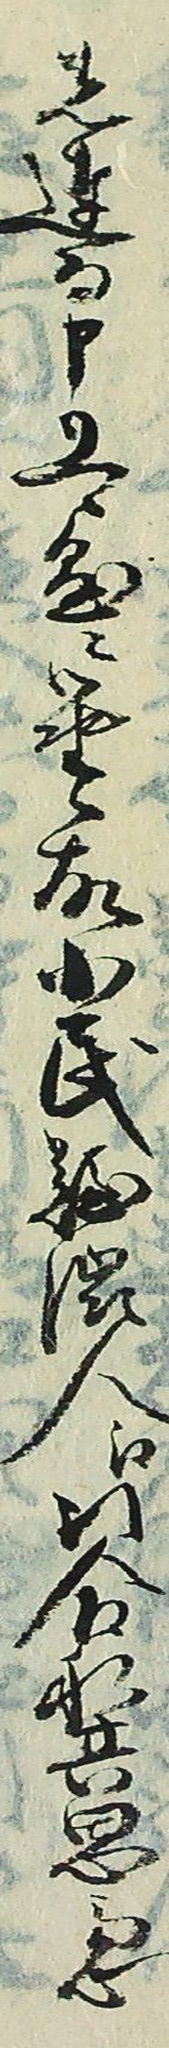先達而申上候様懸に御坐候故小民難渋人江引合私共思慮
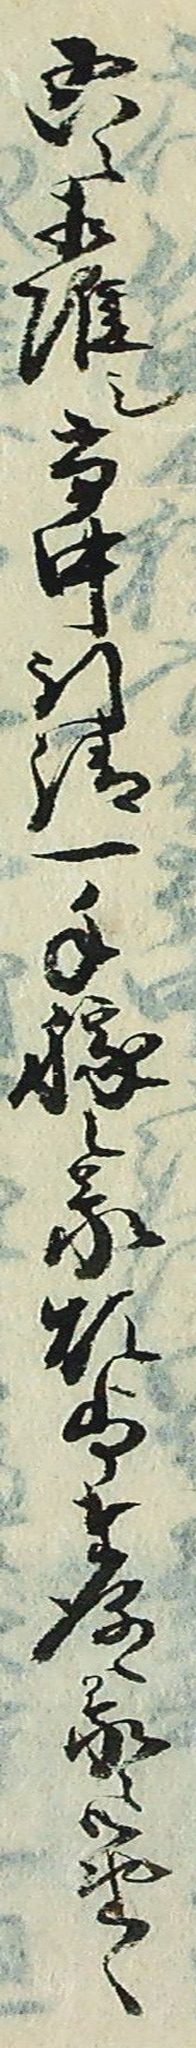右に相准し市中引請一手稼之義煩布奉存候義に御坐候
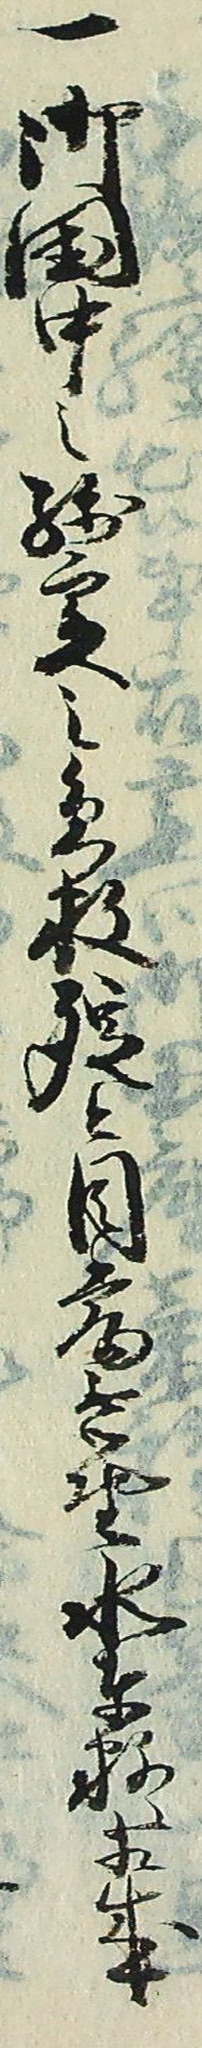一御国中之綿実之員数聢と目当無御坐水車数に相成
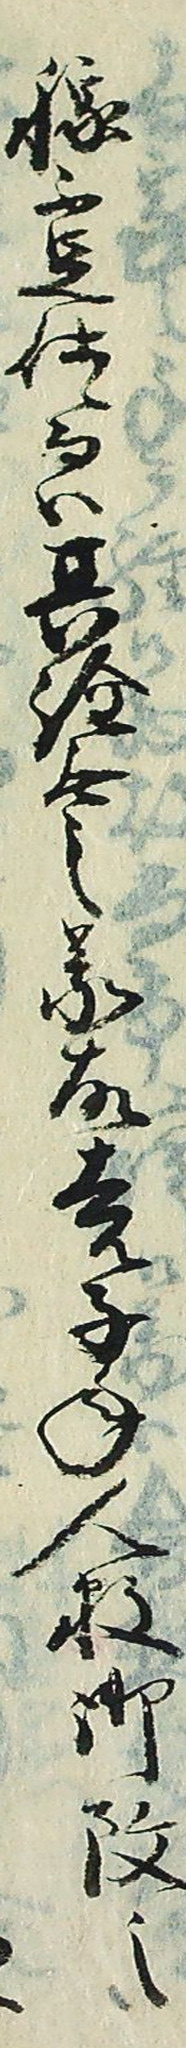稼不足仕候而は其詮無之義故去る子年人数御改之
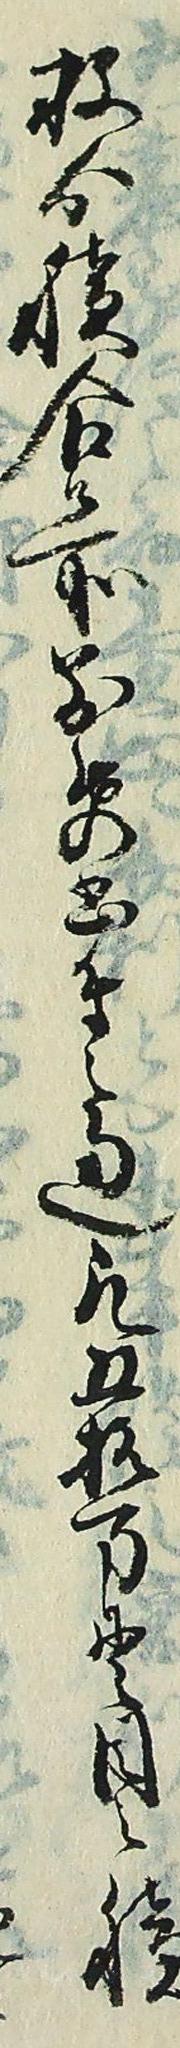数ゟ積合候所別帋書付之通凡五拾万貫目之積
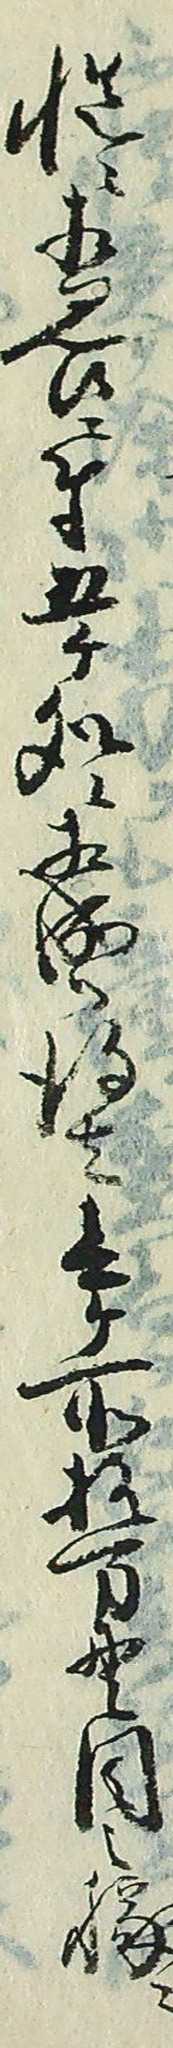慥に相見候に付五ケ処に相成候得者壱ケ所拾万貫目之稼に
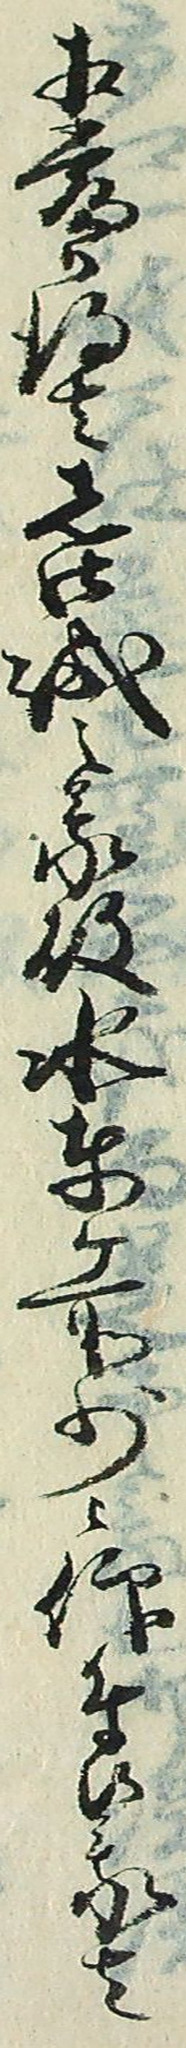相当候得者先御試之義故水車ケ所少被仰付候義者
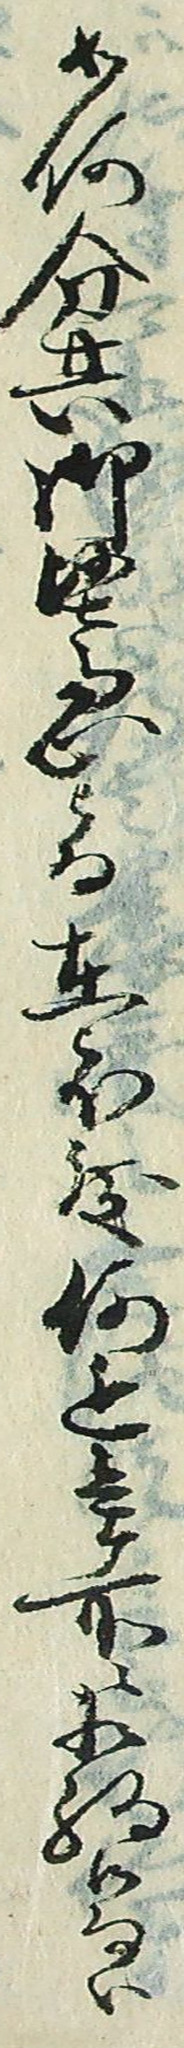如何分共御堅慮被為在被下度何れ壱ケ所に相約候而は
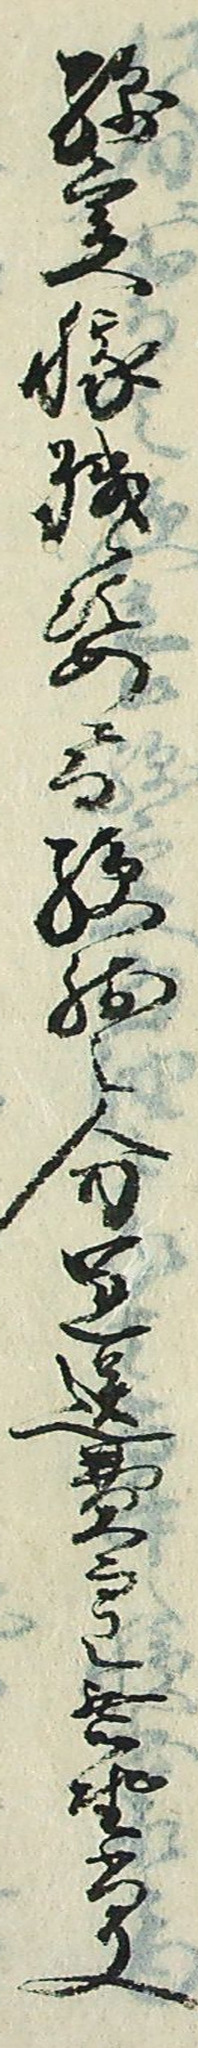綿実稼残候姿に而絞残之分運送費而已無御坐尚又
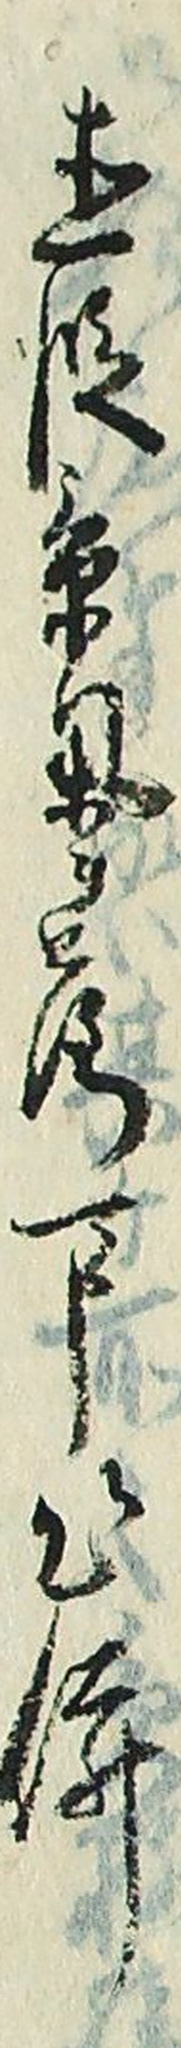直段景気を落可申乍併
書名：油稼御取究ニ附御箇條書テ以被仰渡南北同役申談御答書控
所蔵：鳴門教育大学 Naruto University of Education
